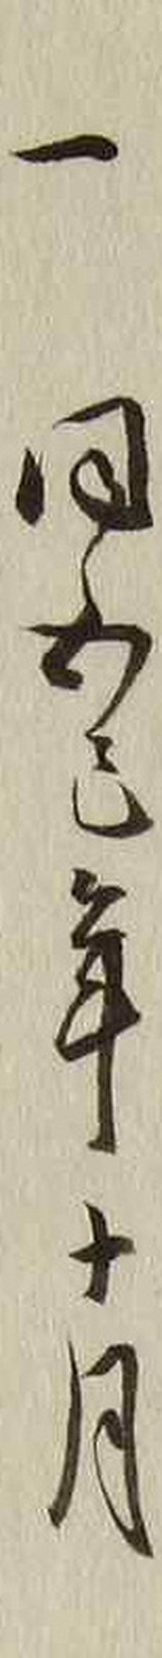一同五巳年十月
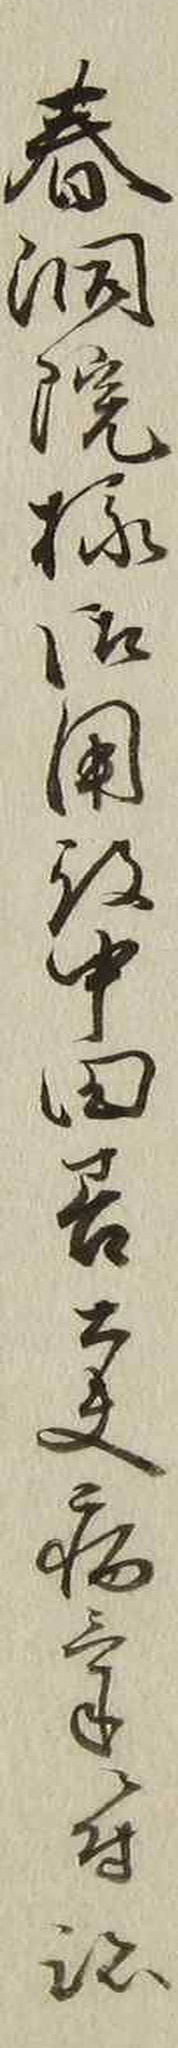春洞院様御用役中田善大夫病気ニ付跡
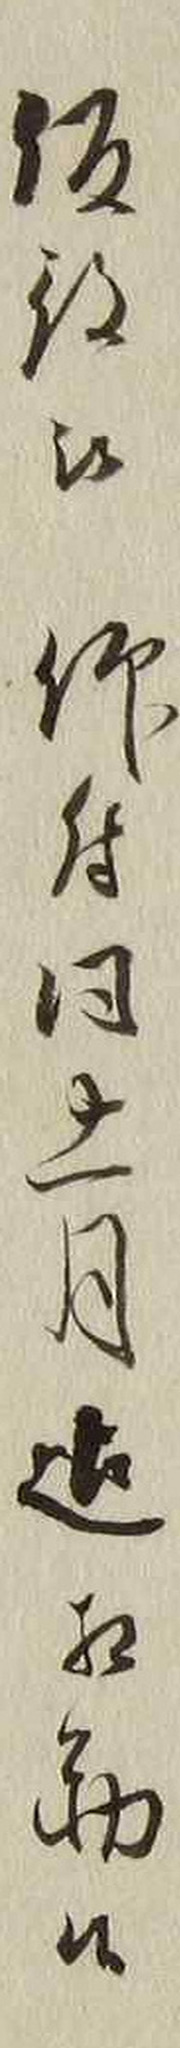仮役被仰付同十一月迄相勤候
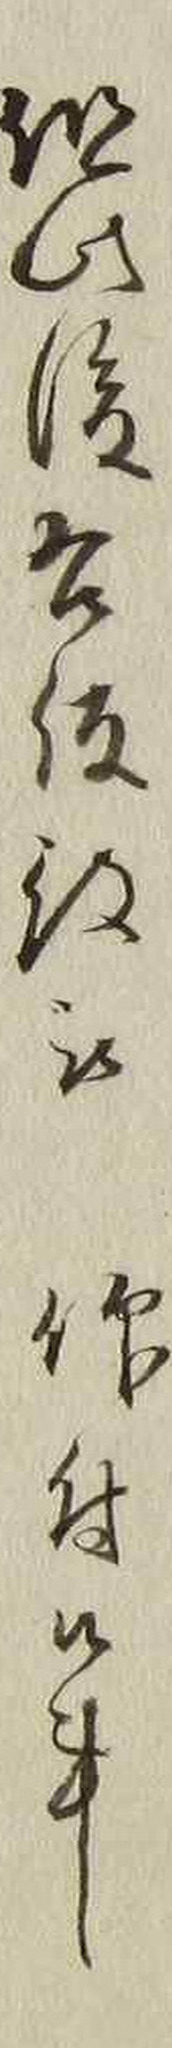但此後右仮役被仰付候事
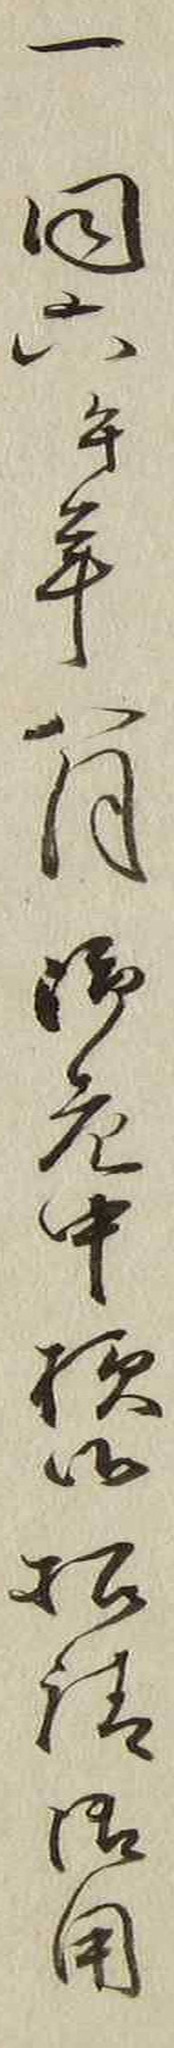一同六午年八月御老中様御招請御用
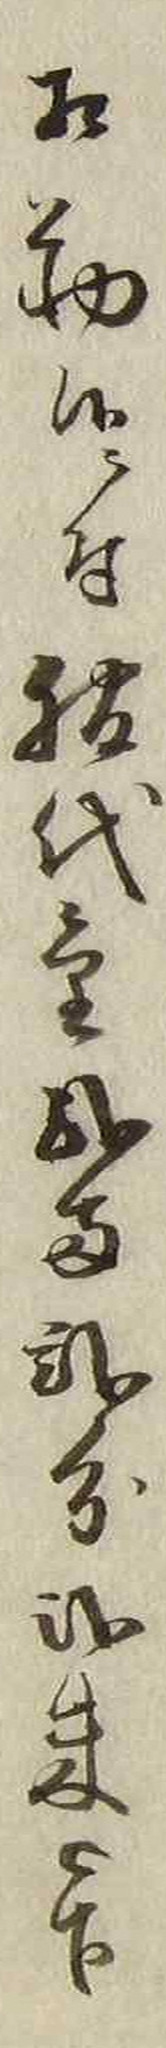相勤候ニ付服代金弐両弐分弐朱被下
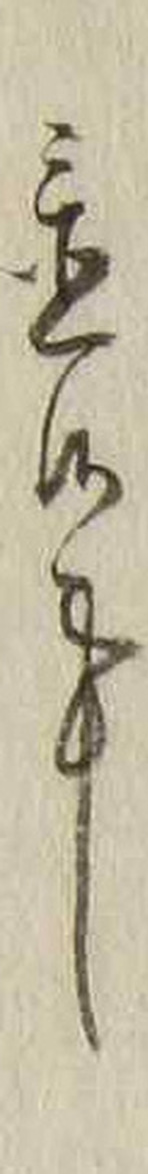置候事

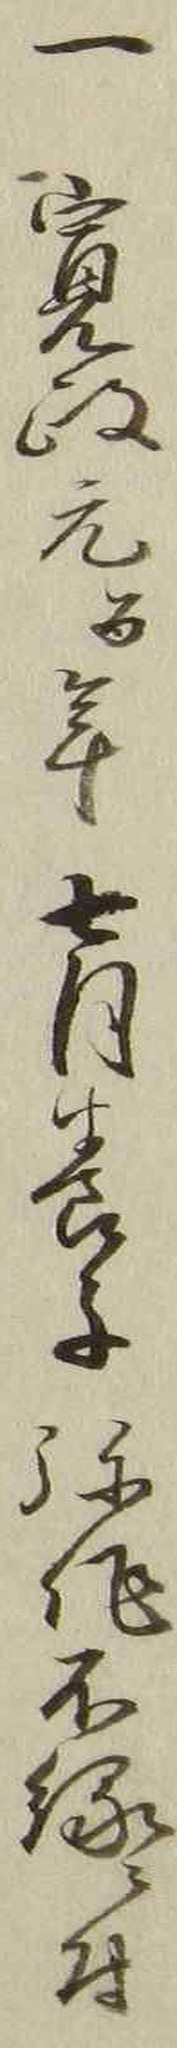一寛政元酉年七月養子弥作不縁ニ付
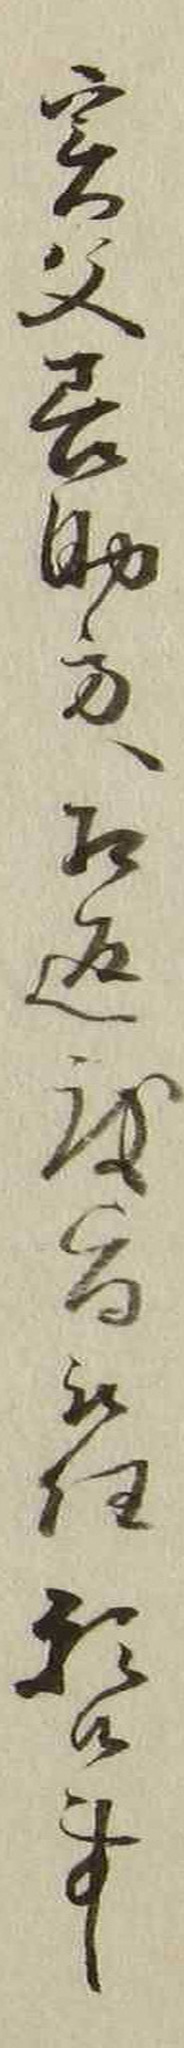実父善助方へ相返度旨被任願候事
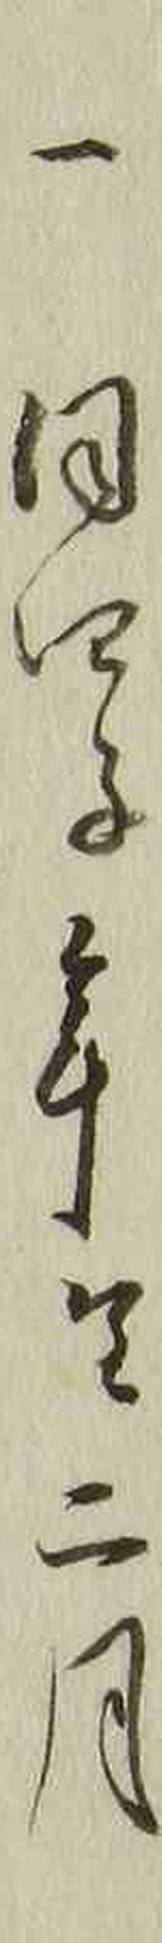一同四子年閏二月
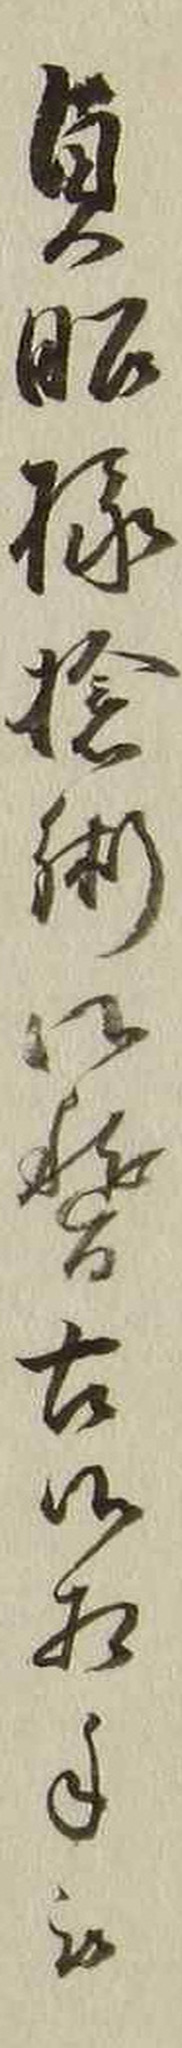貞昭様槍術御稽古御相手被
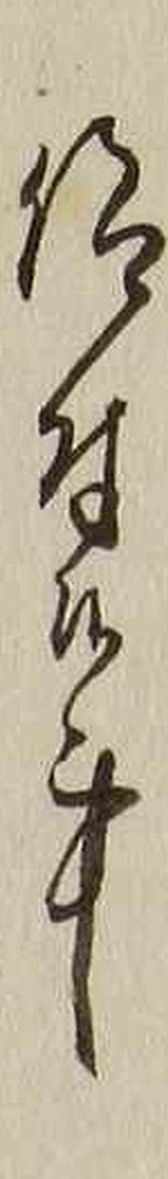仰付候事
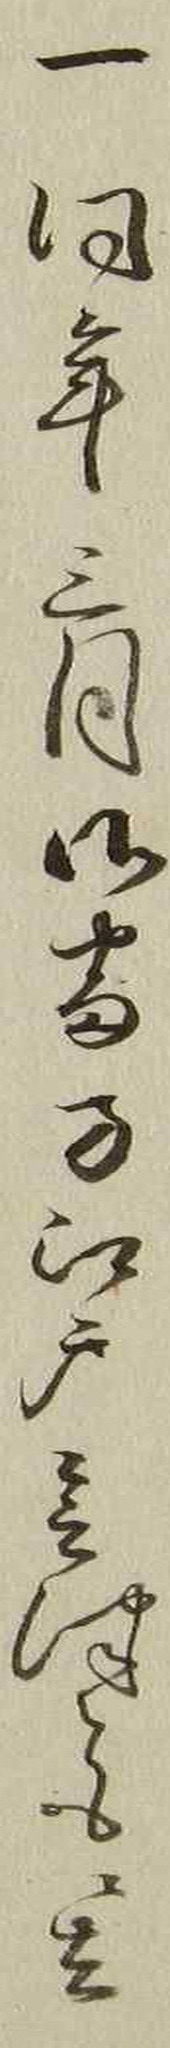一同年三月御番方江戸会津ともニ去
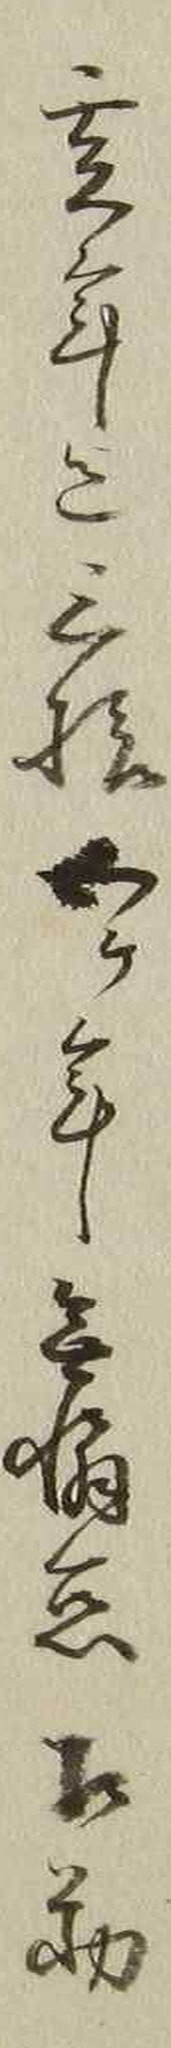亥年迄三拾五ケ年無懈怠相勤
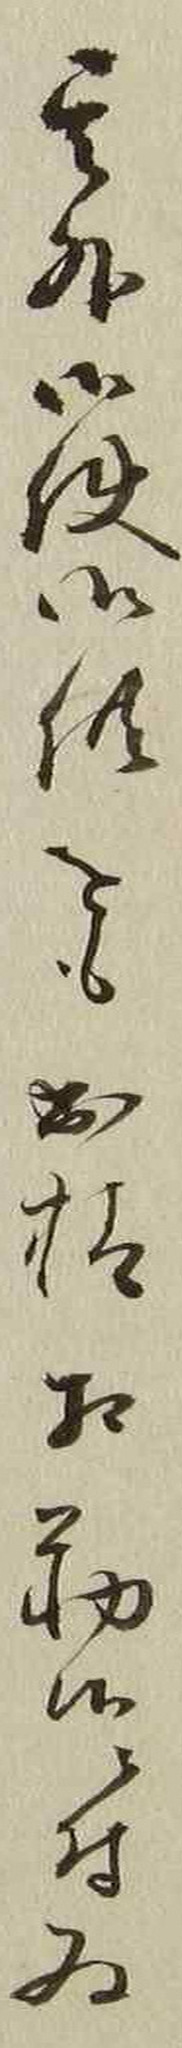其外御使御供をも出精相勤候ニ付為
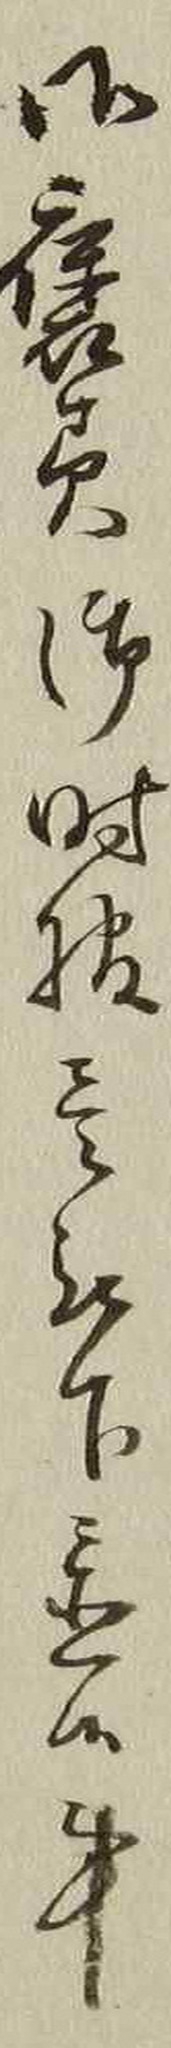御褒美御時服壱被下置候事
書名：諸士系譜　巻之28　い之部28
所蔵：会津若松市立会津図書館
